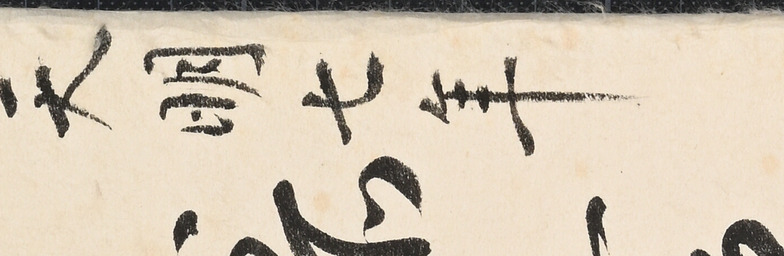天明七年
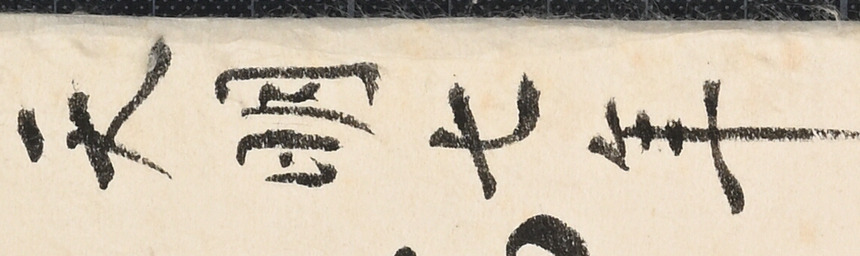天明七年

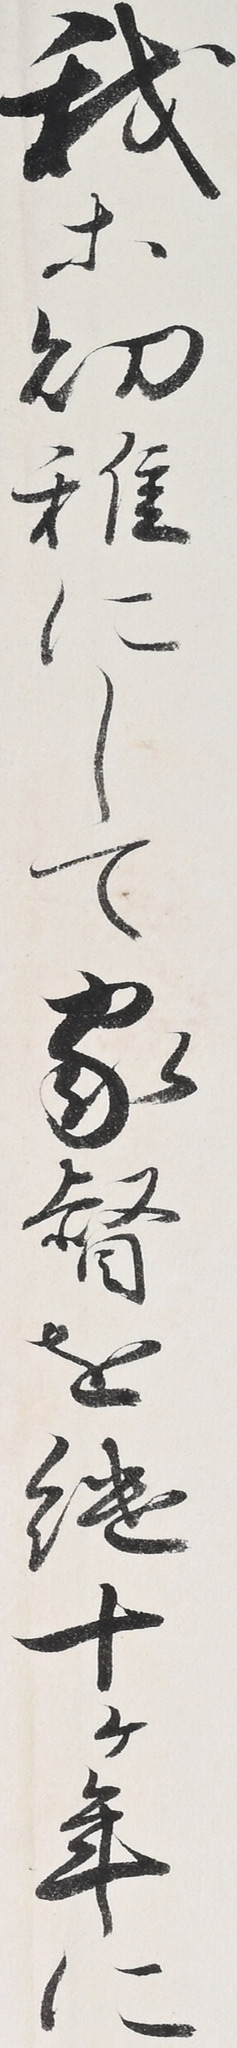我等幼稚にして家督を継十ケ年に
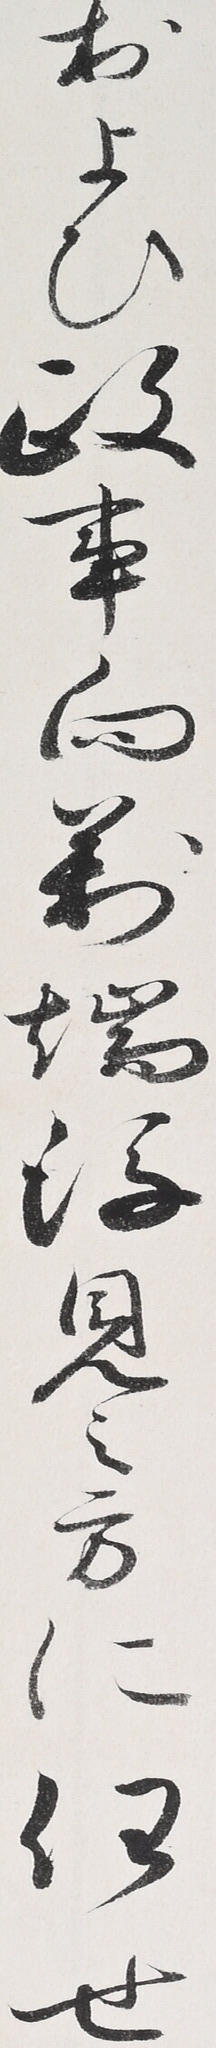およひ政事向万端後見之方に任せ
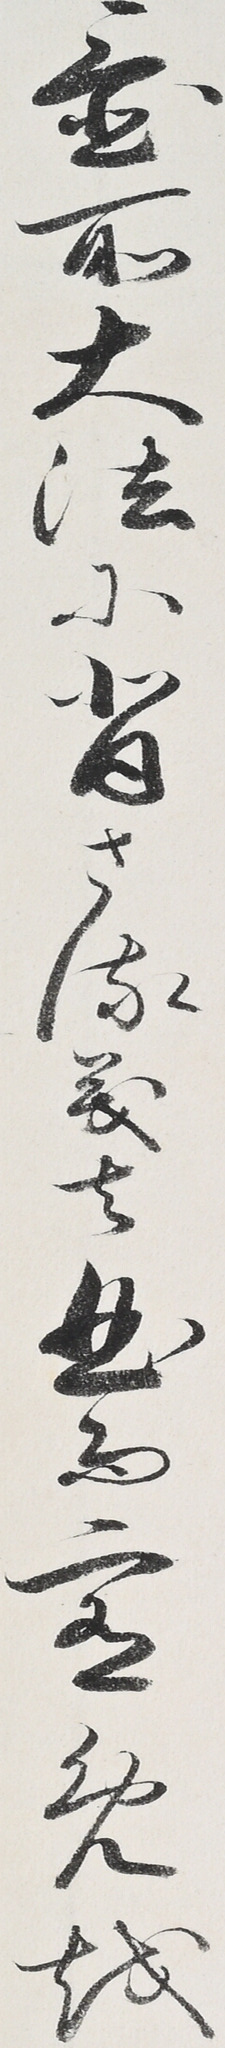置所大法に背さる義は曲て宥免を
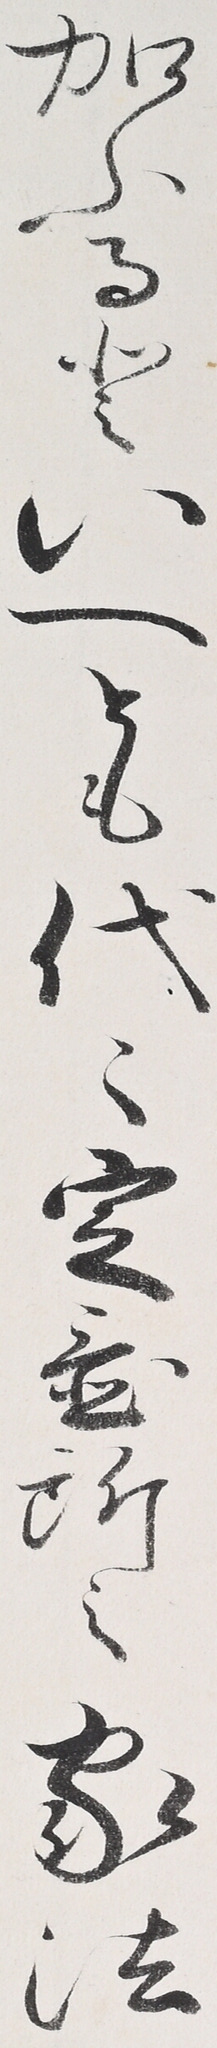加ふるといへとも代々定置所之家法
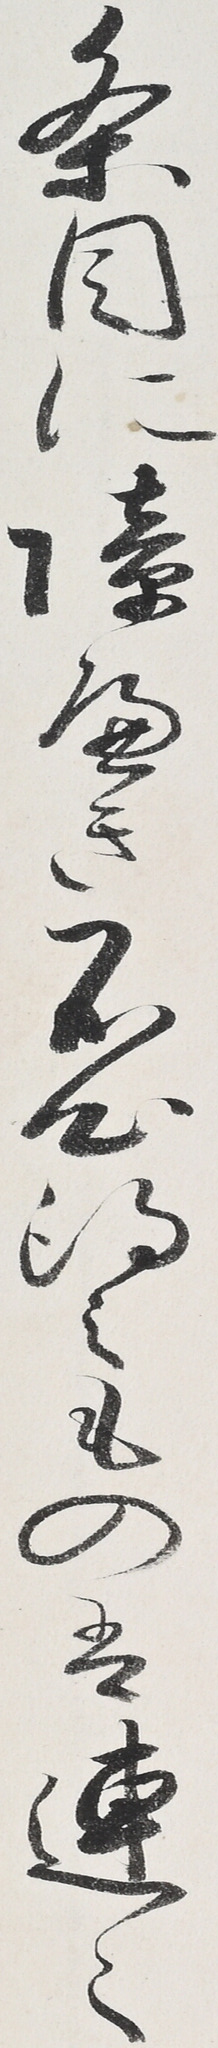条目に障へき不心得之ものは連々
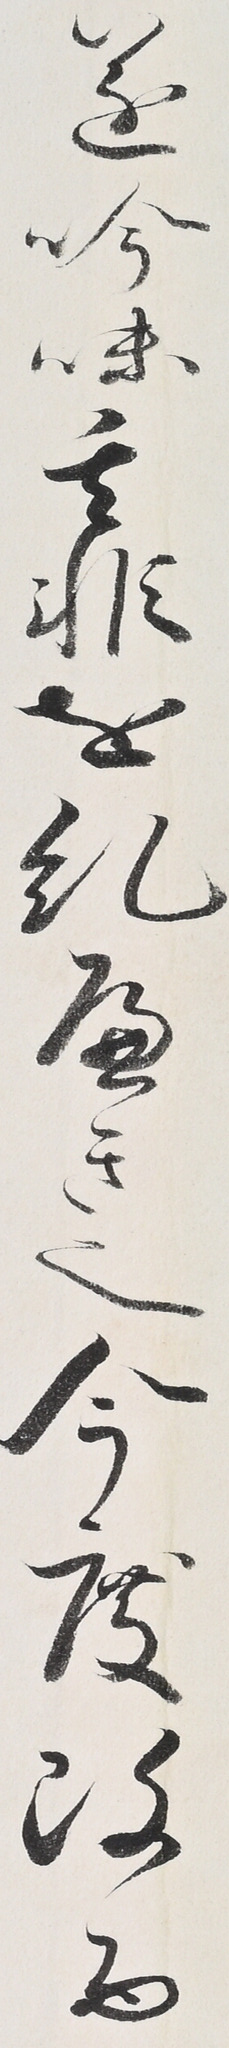遂吟味其非を糺へき也今度改て
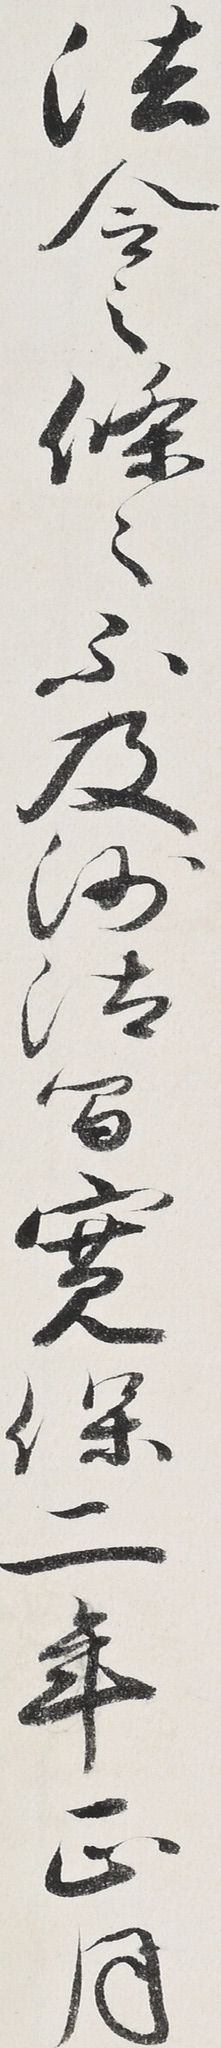法令之條々不及沙汰間寛保二年正月
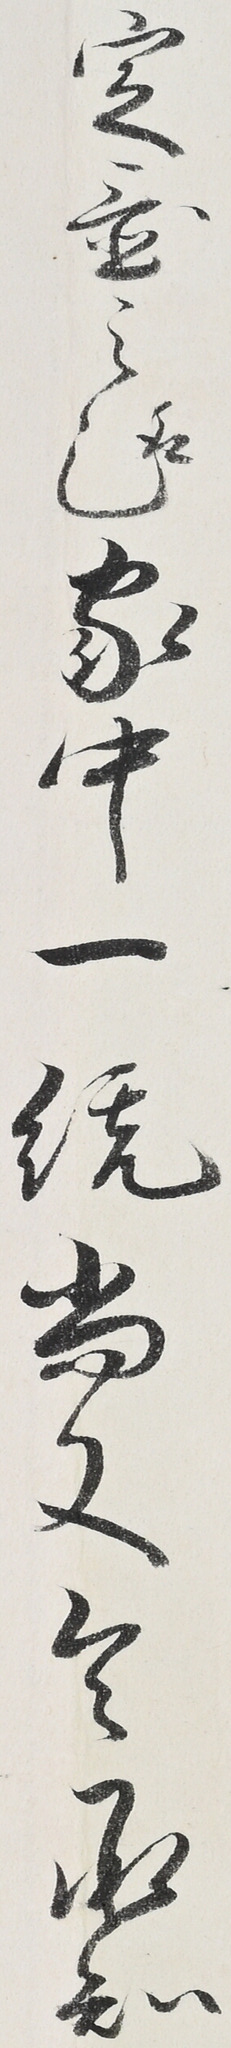定置之趣家中一統尚又令承知
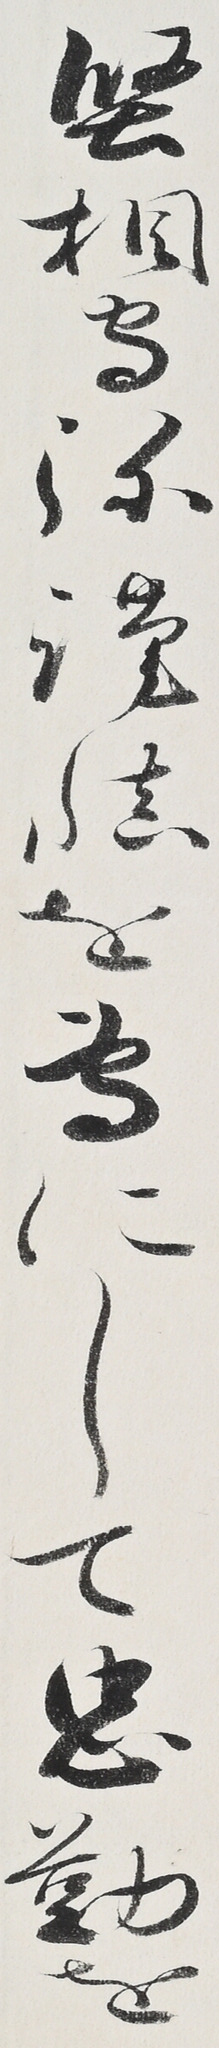堅相守弥謹慎を専にして忠勤を
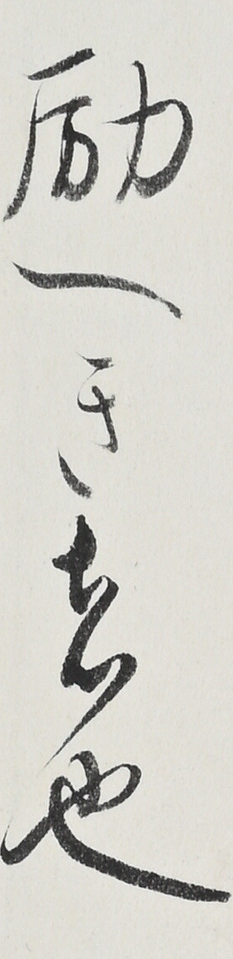励へき者也
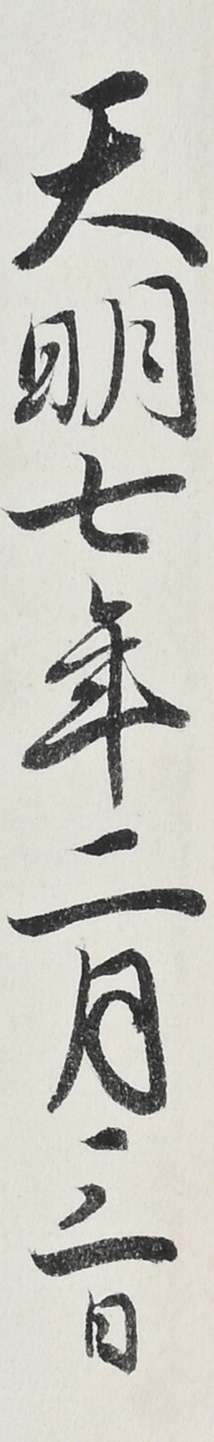天明七年二月三日

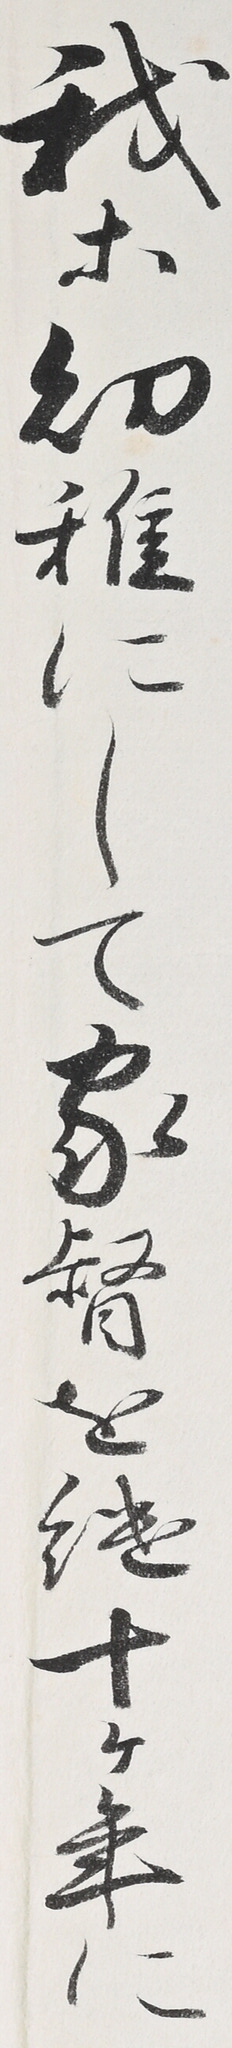我等幼稚にして家督を継十ケ年に
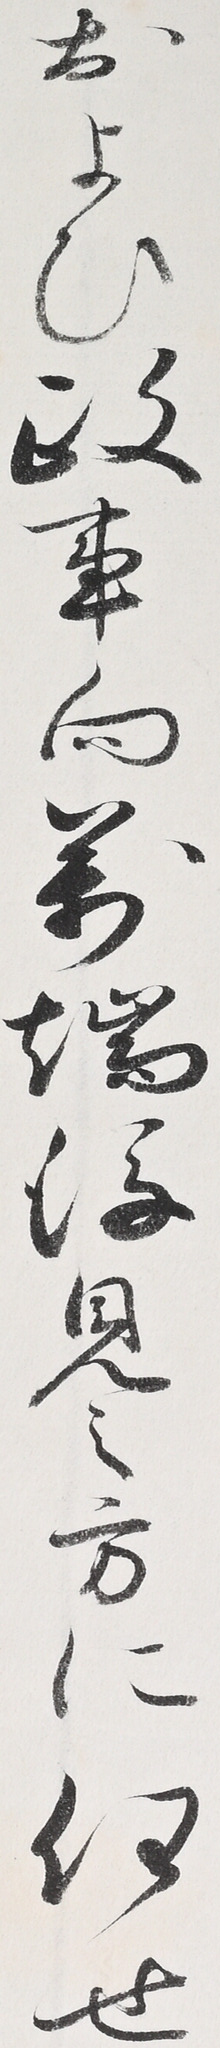およひ政事向万端後見之方に任せ
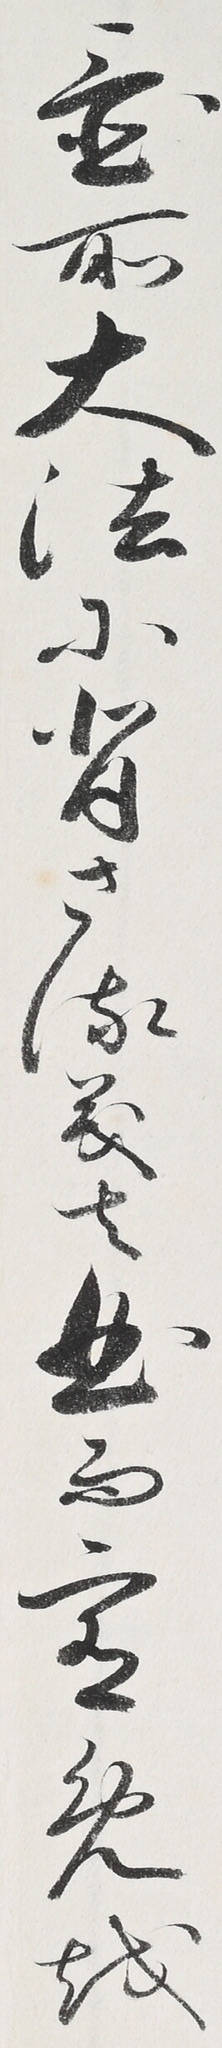置所大法に背さる義は曲て宥免を
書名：御添書
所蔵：伊那市立高遠町図書館・合同会社AMANE
